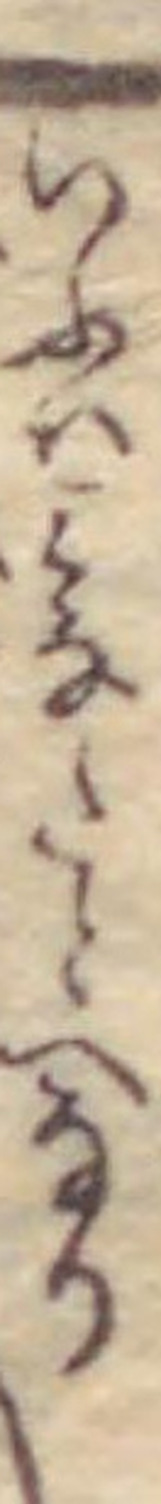いふはみなたとへなり
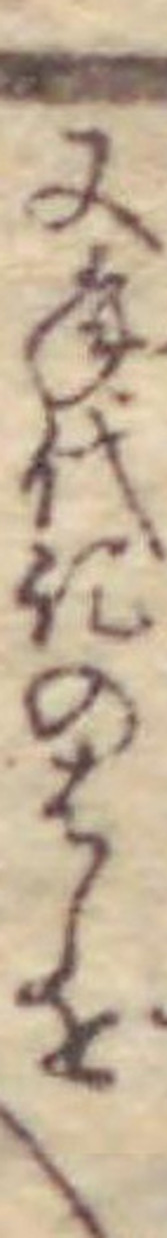又年代記のはしを
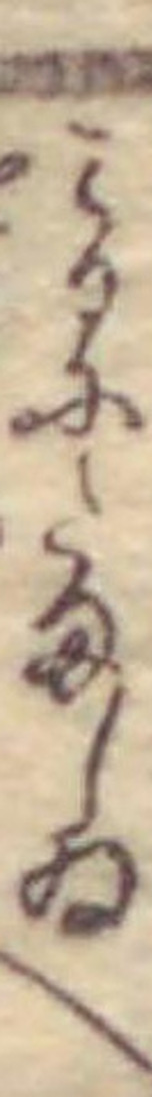みるにたましゐ
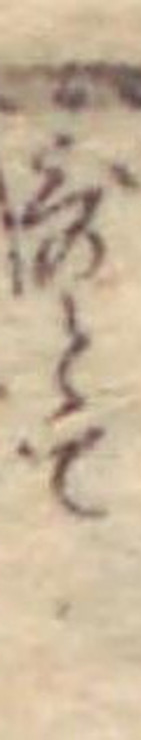哥とて
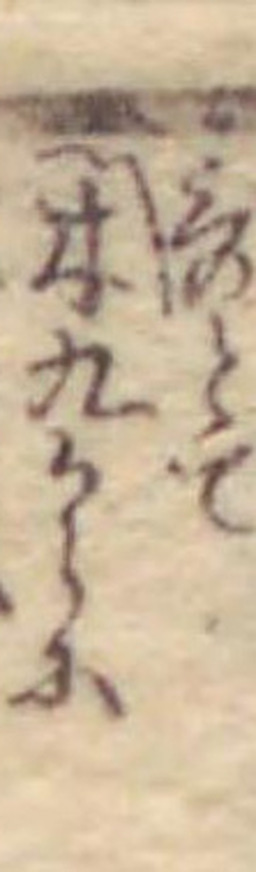〽木九からに
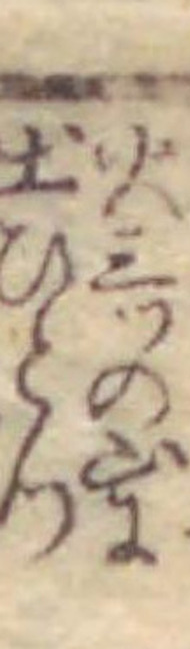土ひとつ
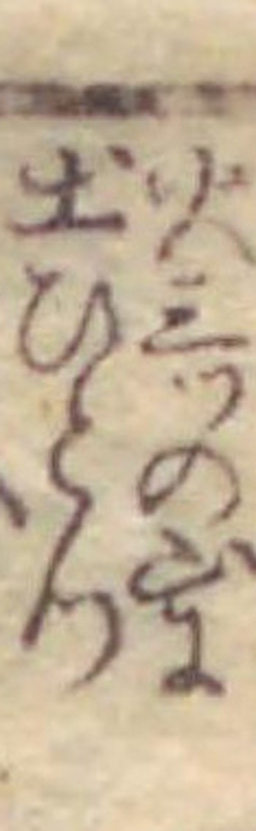土ひとつ
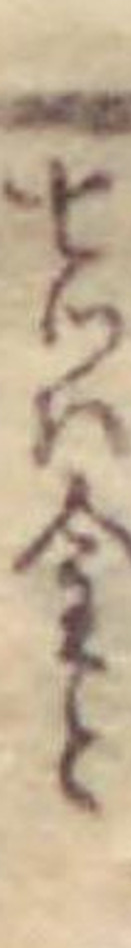七つは金と
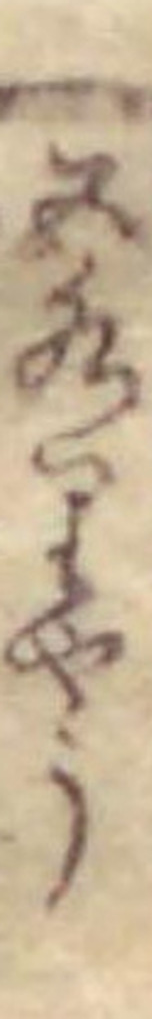五水りやう
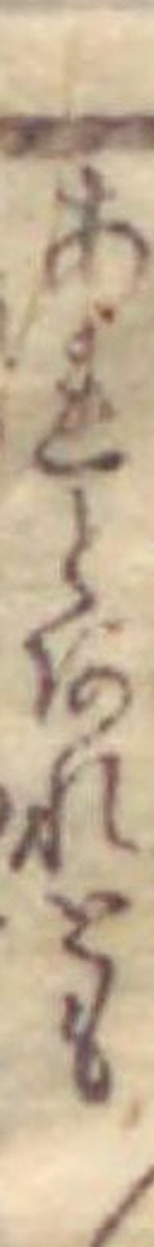あれとあれとも
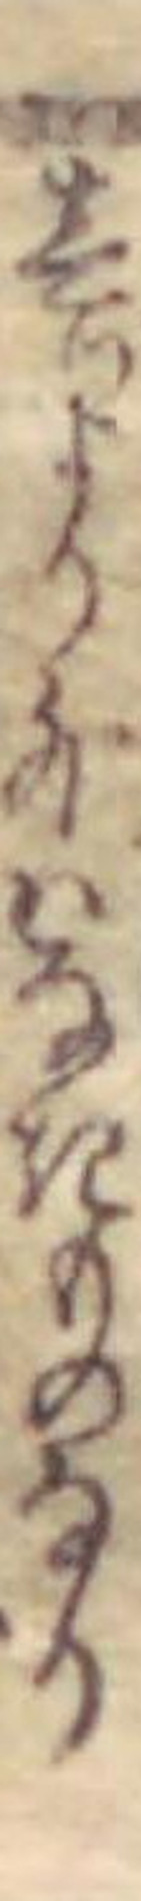壱つより外はなきものなり
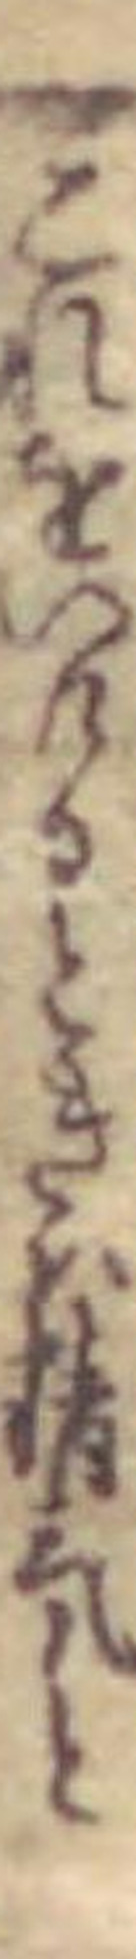これをいけるときは精気と
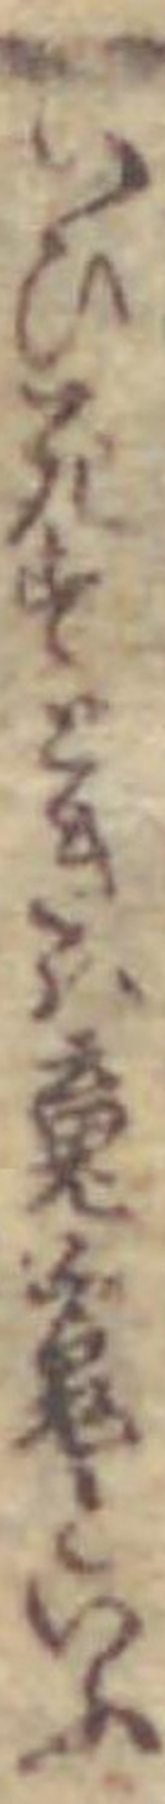いひ死すときは魂魄といふ
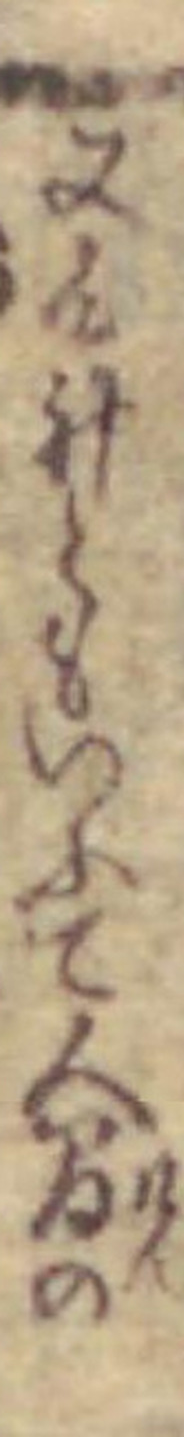又心神ともいふて人間の
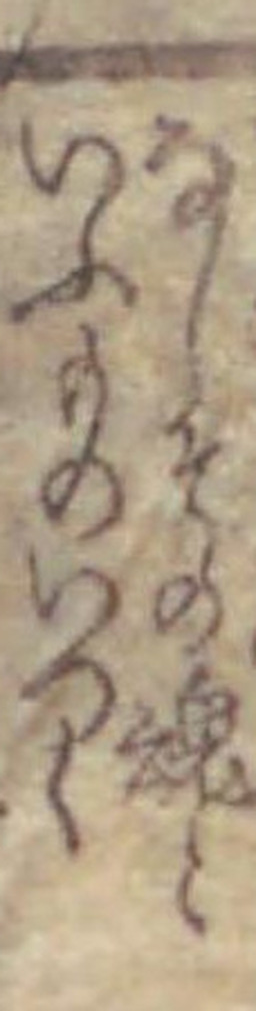いふものいつゝ
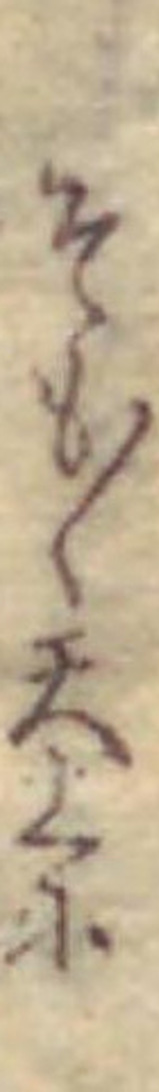そも〳〵天上に
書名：心学早染艸 : 3巻
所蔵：国立国会図書館 National Diet Library, JAPAN
